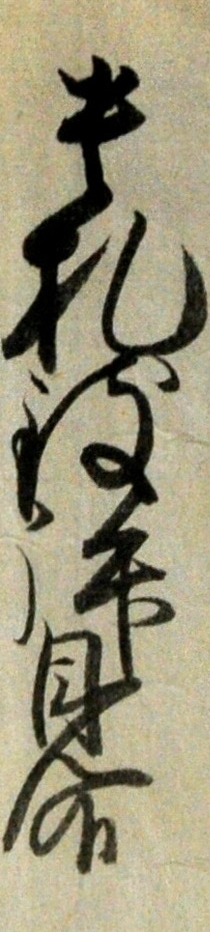貴札致拝見候
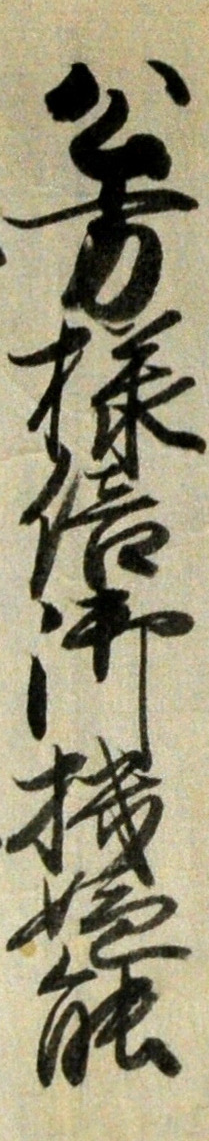公方様倍御機嫌能
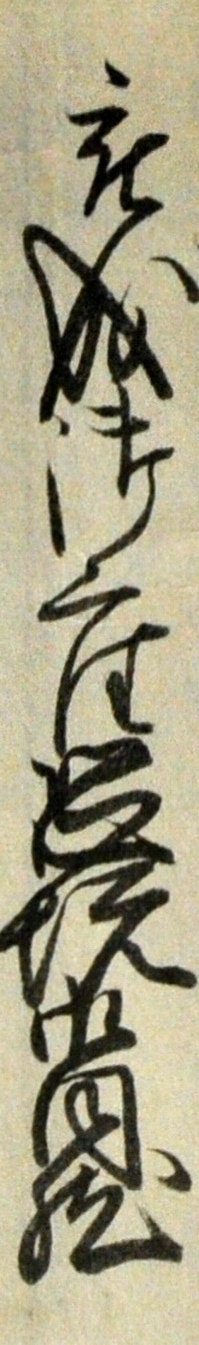被成御座恐悦御同然
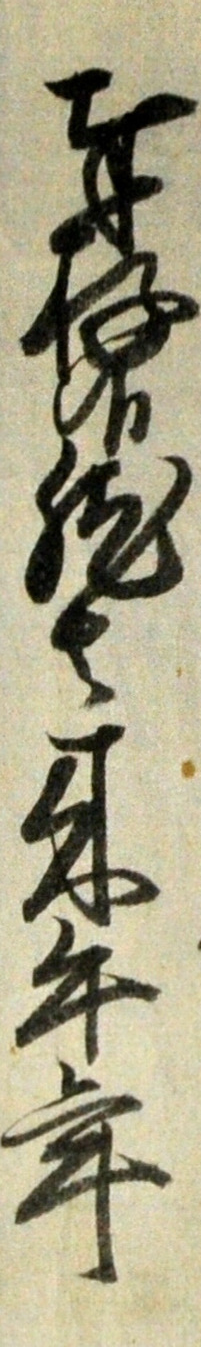奉存候然は来午年
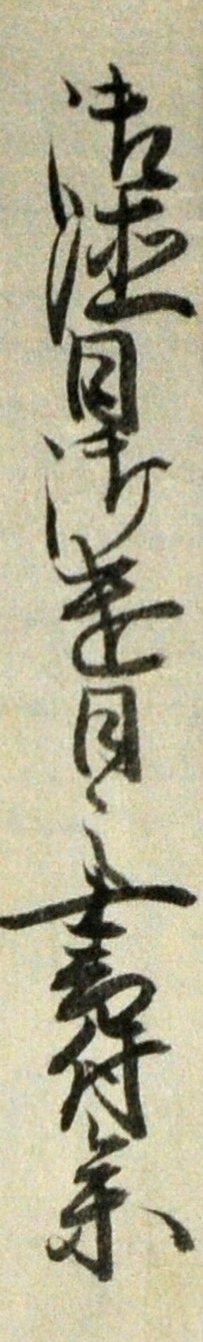御徳日御遣日之書付参
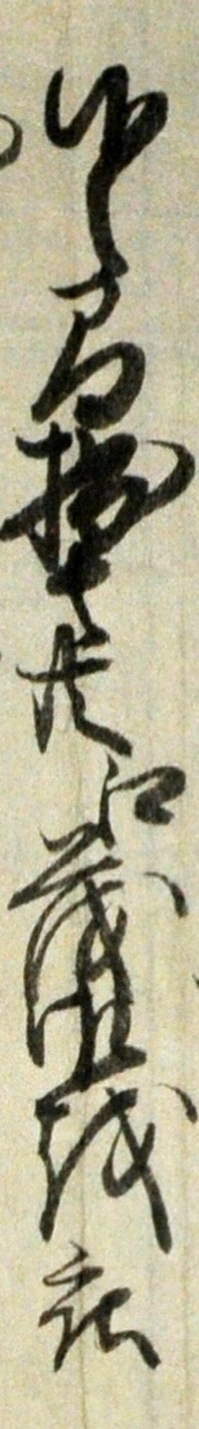候之間拙者共えも御越被
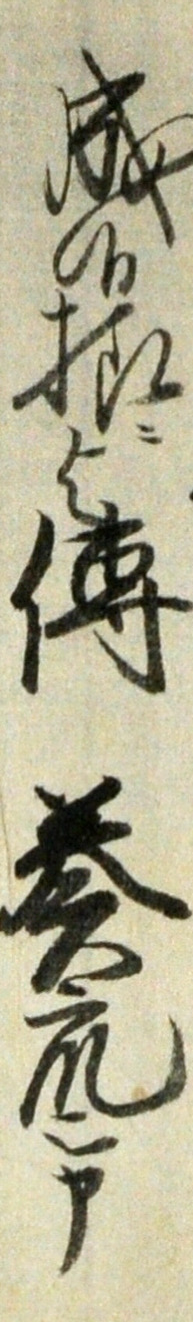成候様にと伝奏衆之申
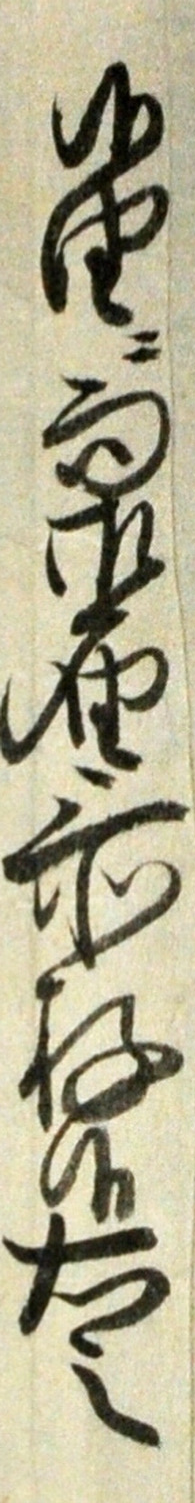候由にて御届忝存候右之
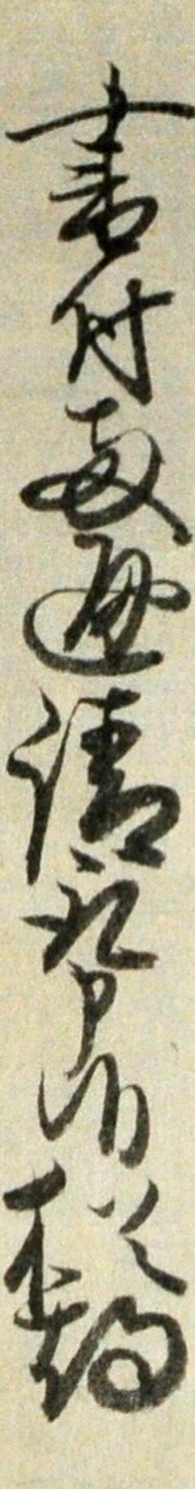書付両通請取申候猶期
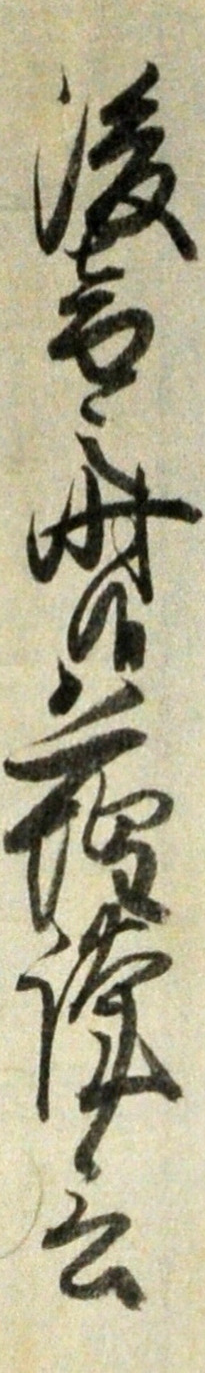後音之時候恐惶謹言
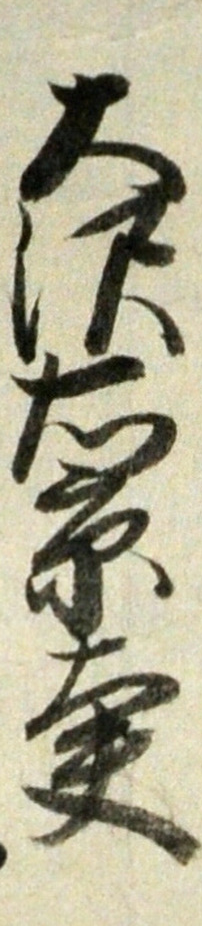大沢右京大夫
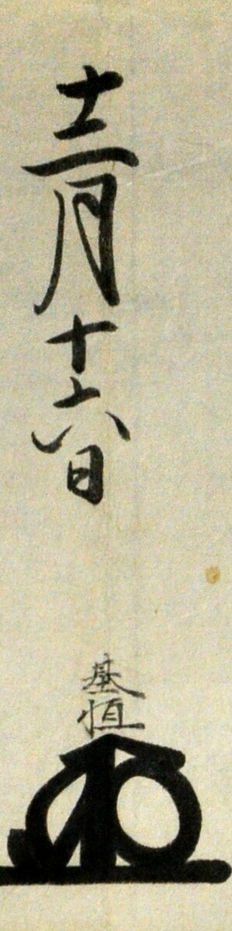十二月十六日基恒
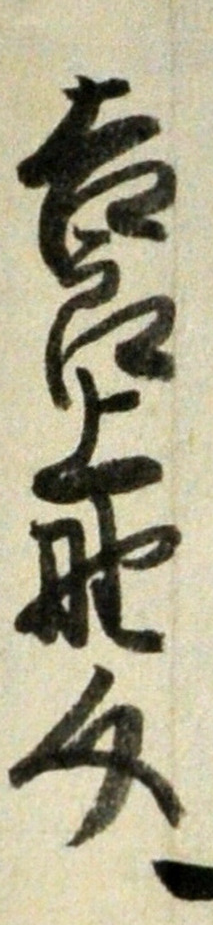吉良上野介
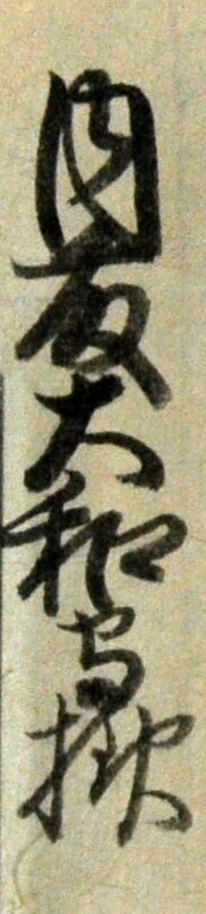内藤大和守様
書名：書状
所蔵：伊那市立高遠町図書館・合同会社AMANE
